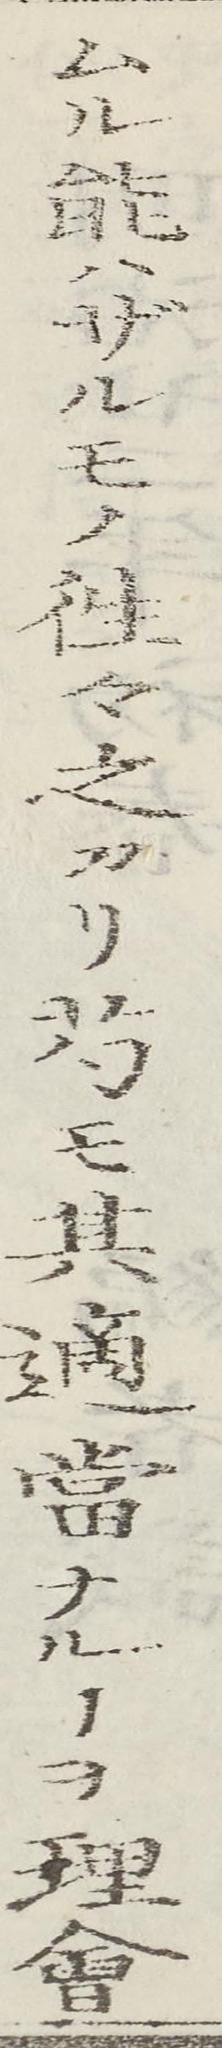ムル能ハザルモノ往々之カリ芍モ其適当ナルコトヲ理会
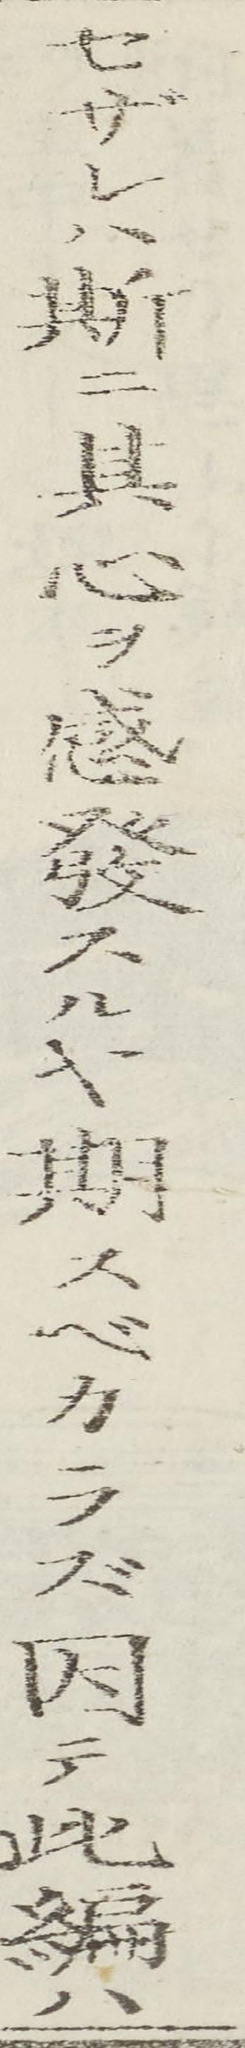セザレハ斯ニ其心ヲ感発スルヤ期スベカラズ因テ此編ハ
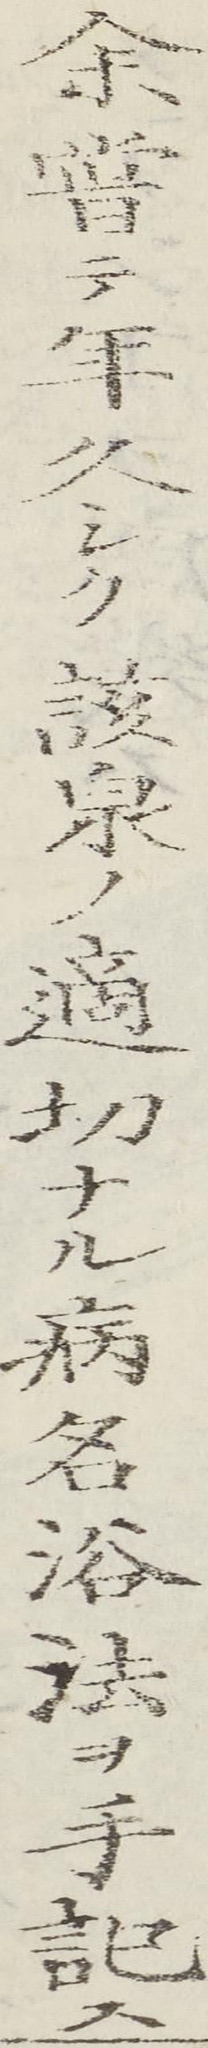余嘗テ年久シク該泉ノ適切ナル病名浴法ヲ手記ス
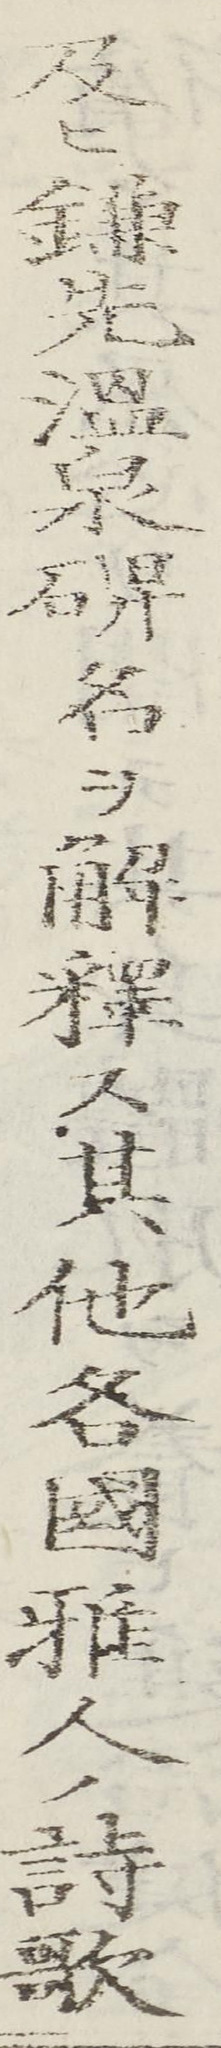及ヒ鎌先温泉碑名ヲ解釈ス其他各国雅人ノ詩歌
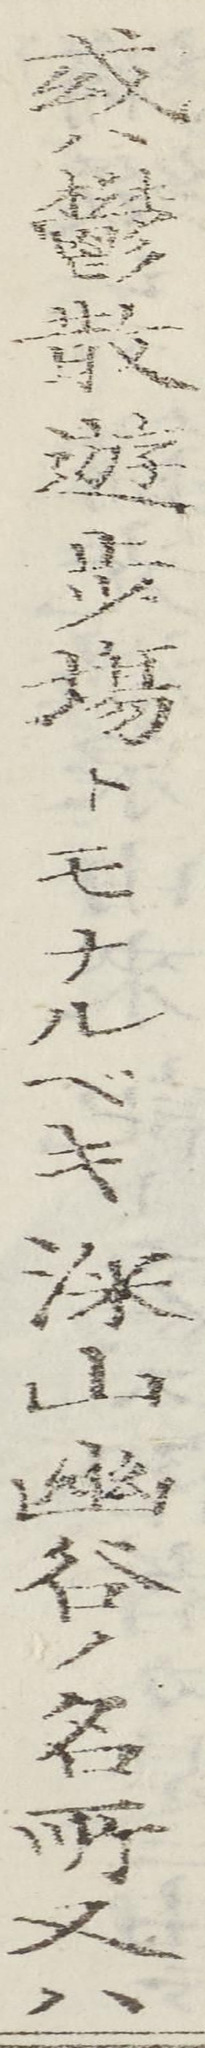或ハ鬱散遊歩場トモナルベキ深山幽谷ノ名所又ハ
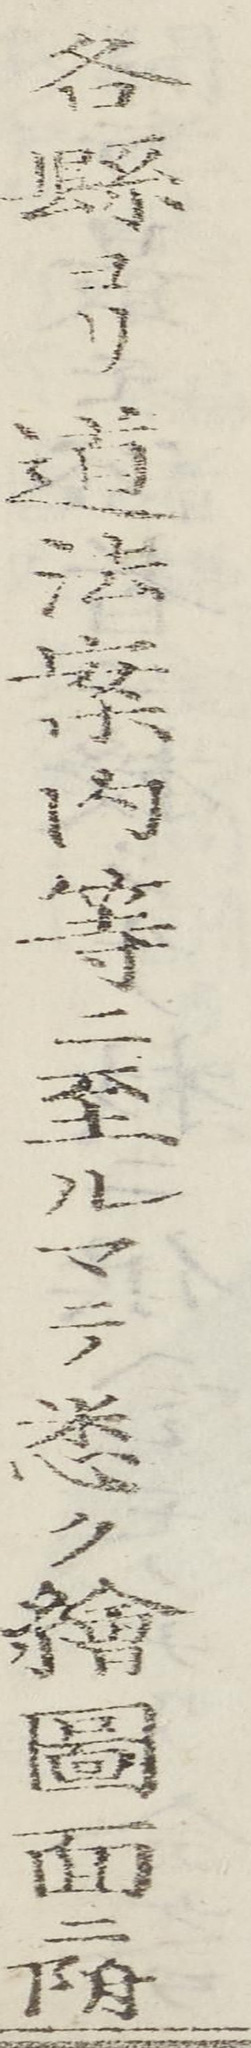各県ヨリ道法案内等ニ至ルマテ悉ク絵図面ニ附

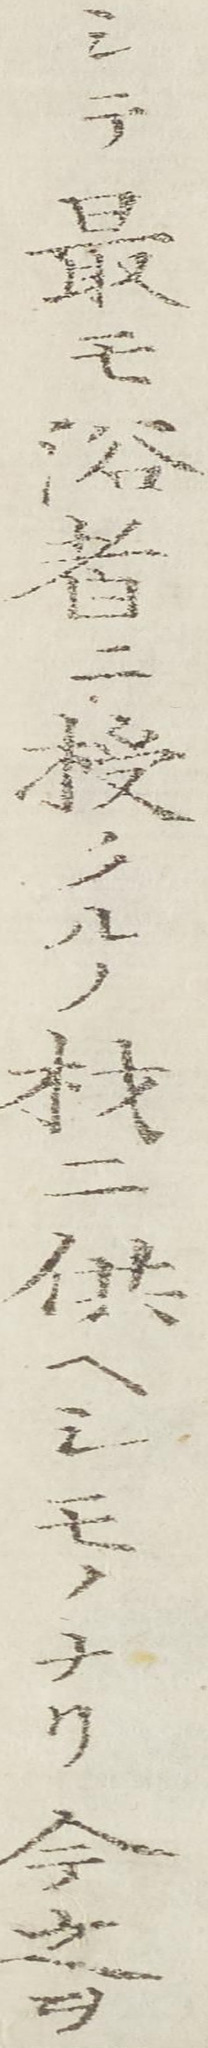シテ最浴者ニ授クルノ材ニ供ヘシモノナリ今之ヲ
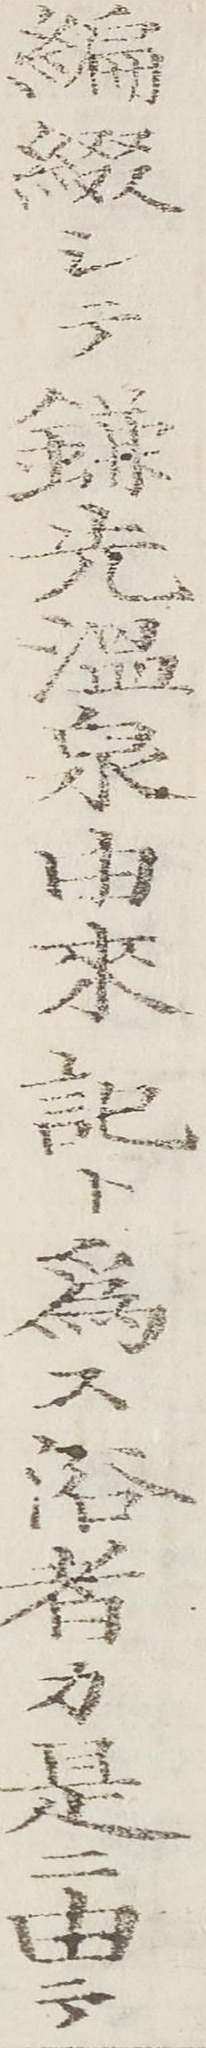編綴シテ鎌先温泉由来記ト為ス浴者カ是ニ由テ
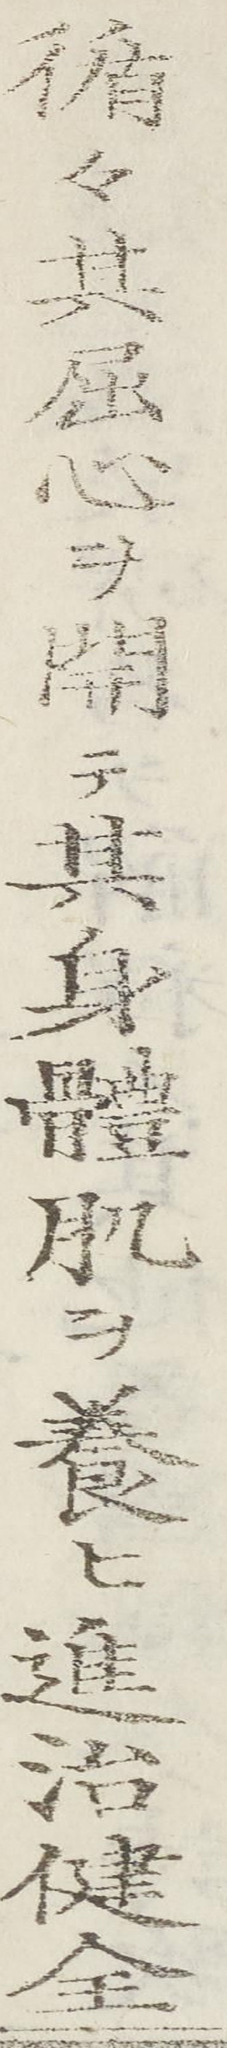循々其屈心ヲ開テ其身体肌ヲ養ヒ進治健全
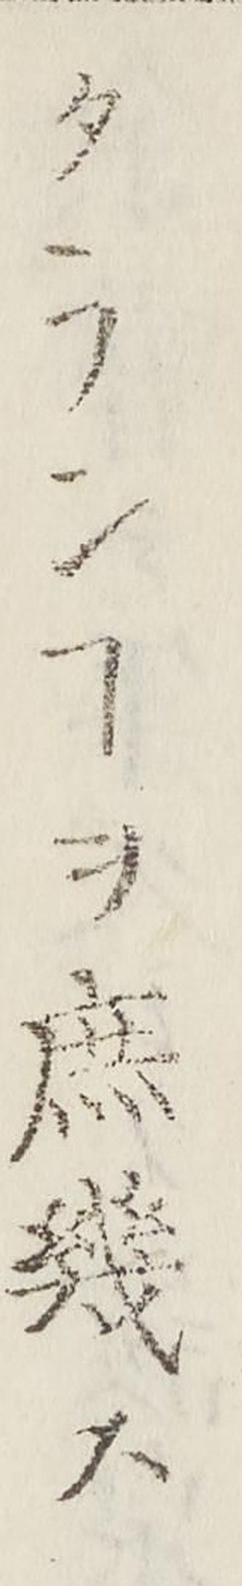タランコトヲ庶幾ス
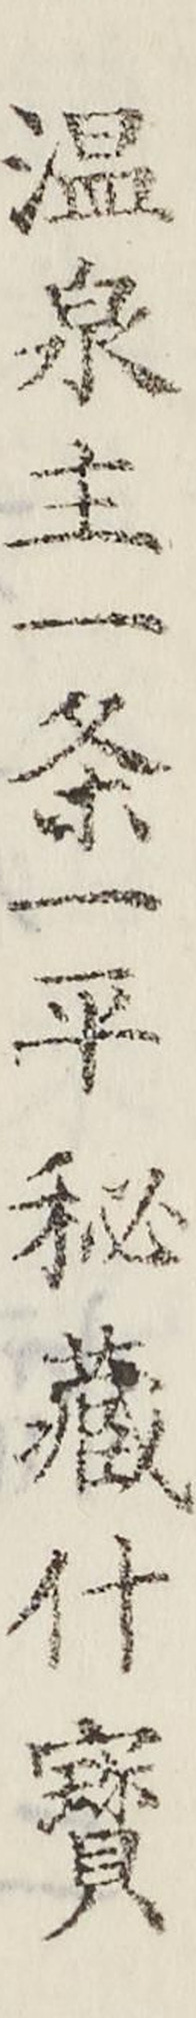温泉主一条一平秘蔵什宝
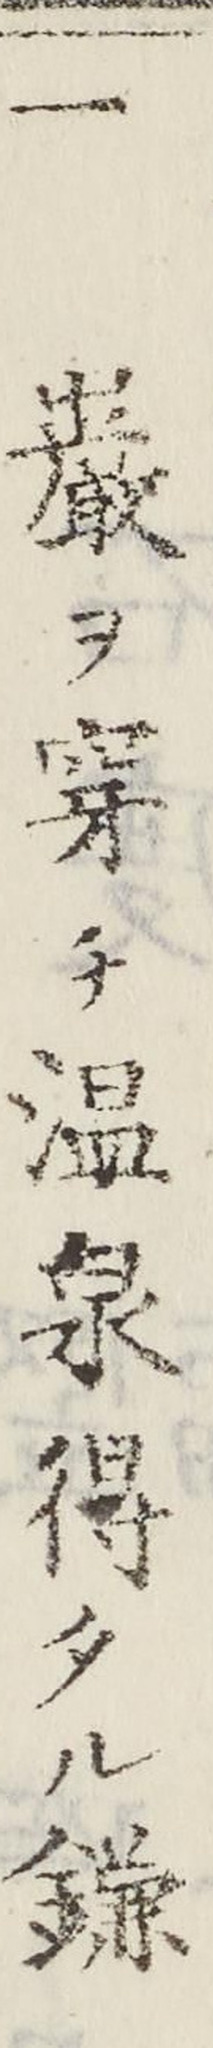一巌ヲ穿チ温泉得タル鎌
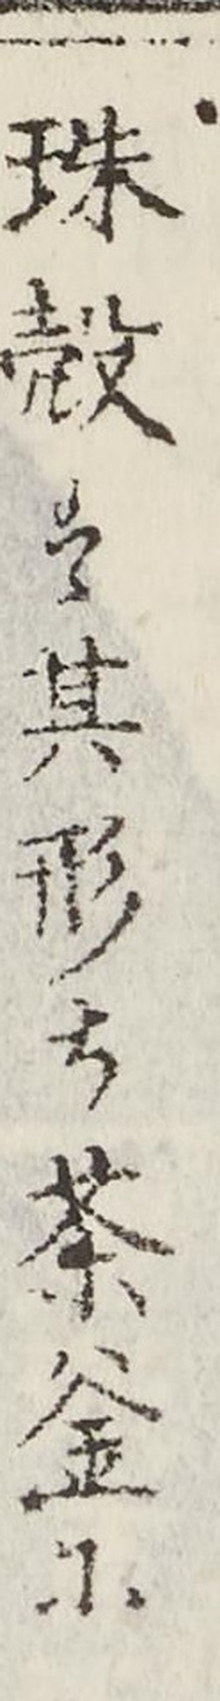珠殻は其形ち茶釜に
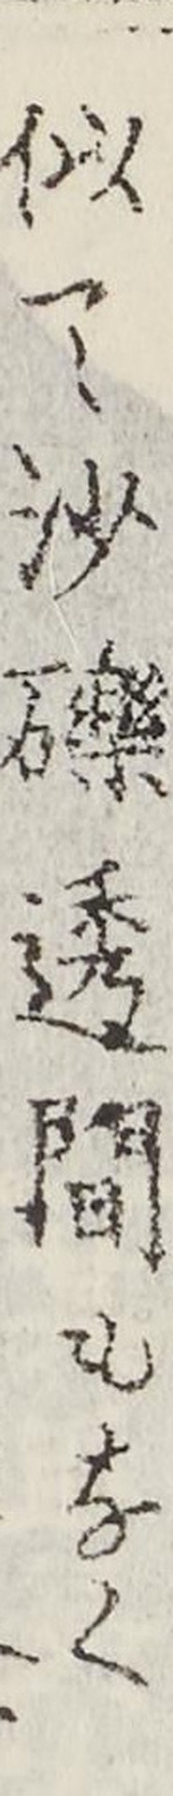似て沙礫透間もなく
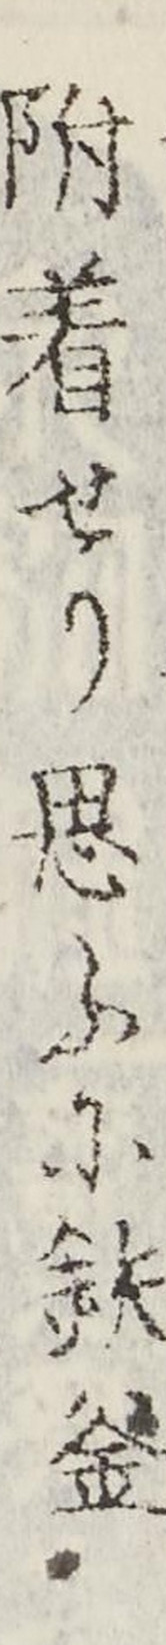附着せり思ふに鉄釜
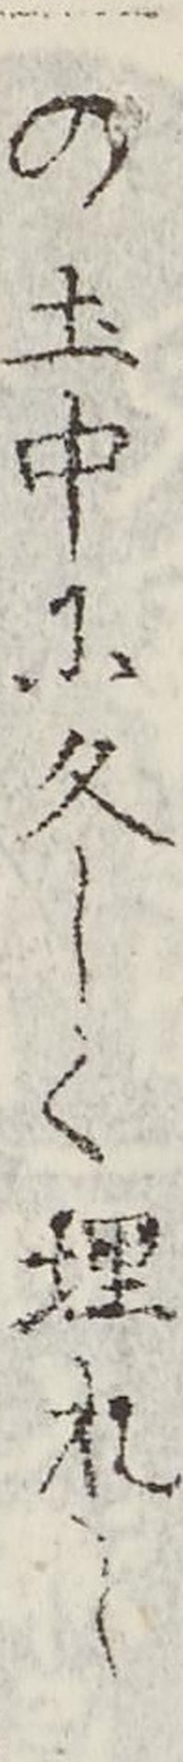の土中に久しく埋れし
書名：鎌先温泉由來記
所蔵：東京大学地震研究所図書室 Earthquake Research Institute Library, The University of Tokyo, JAPAN
